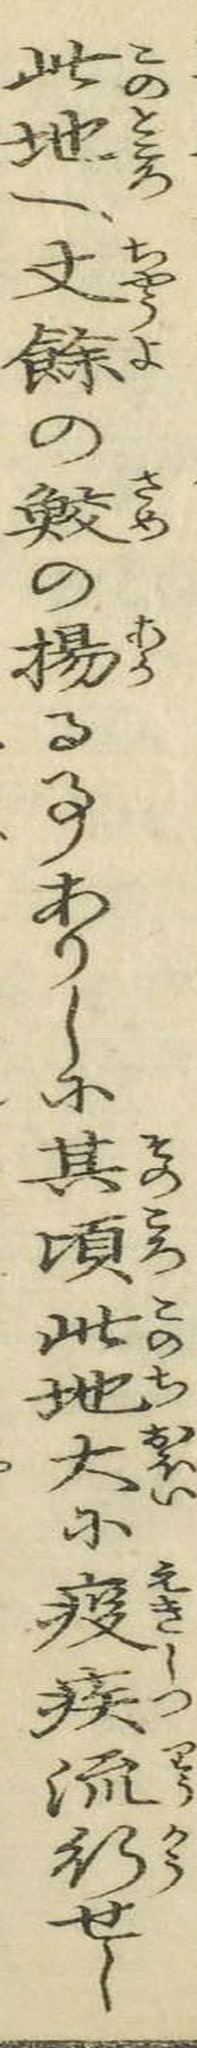此地へ丈餘の鮫の揚る事ありしに其頃此地大に疫疾流行せし
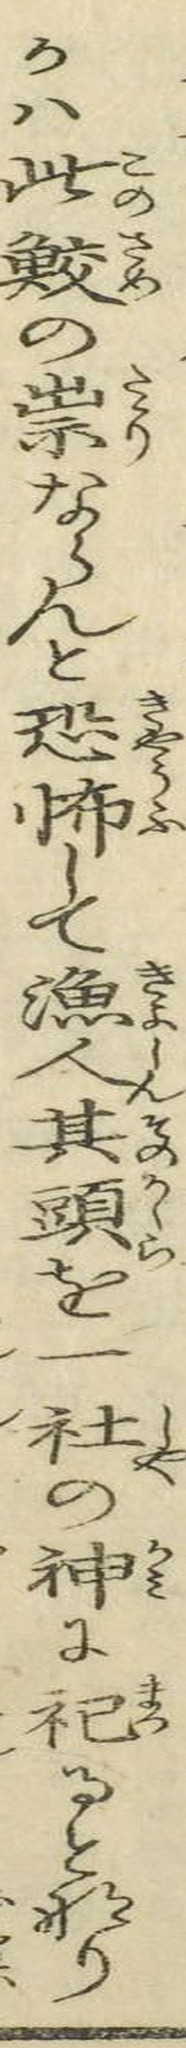かは此鮫の祟ならんと恐怖して漁人其頭を一社の神に祀るとなり
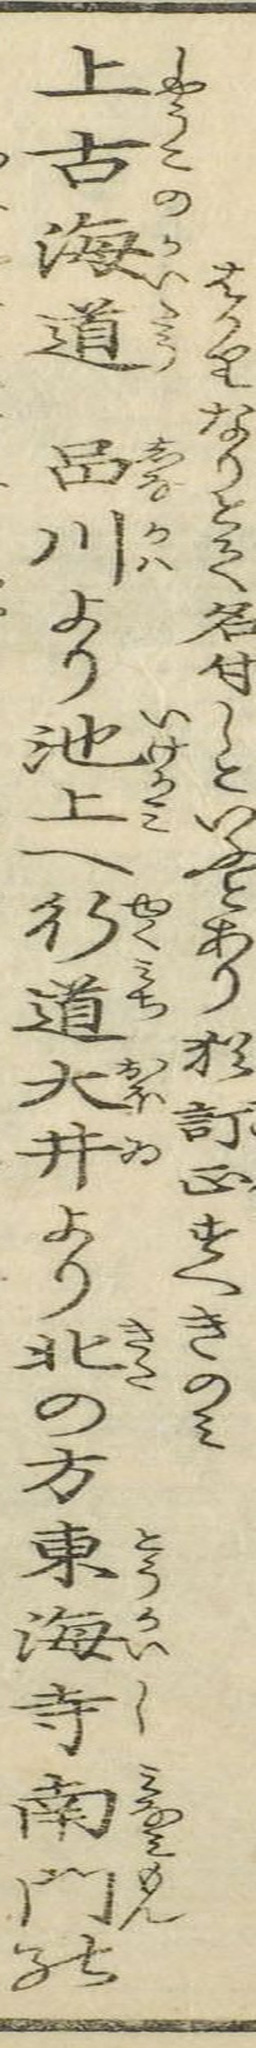上古海道品川より池上へ行道大井より北の方東海寺南門の
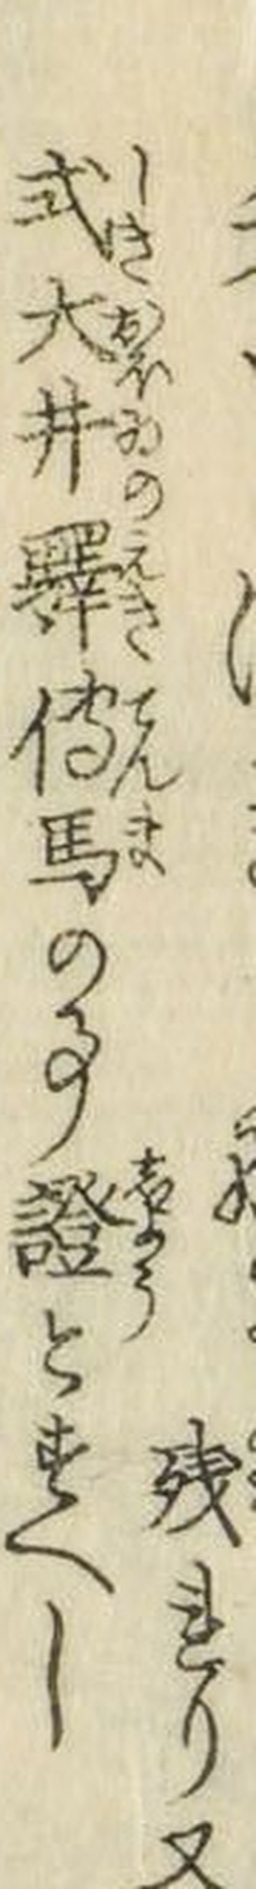式大井驛傳馬の事證とすへし
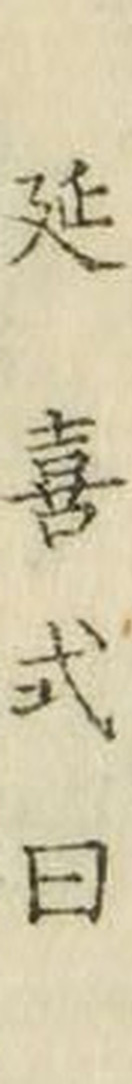延喜式曰
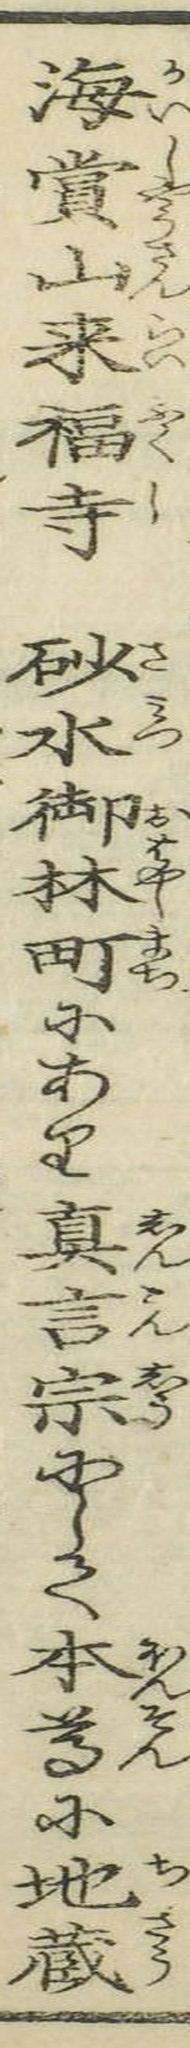海賞山来福寺砂水御林町にあり真言宗にして本尊に地蔵
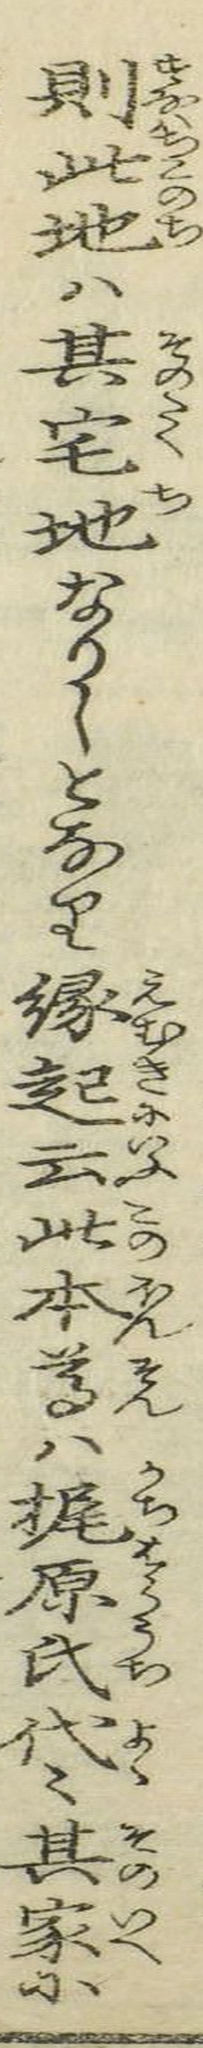則此地は其宅地なりしとなり縁起云此本尊は梶原氏代々其家に
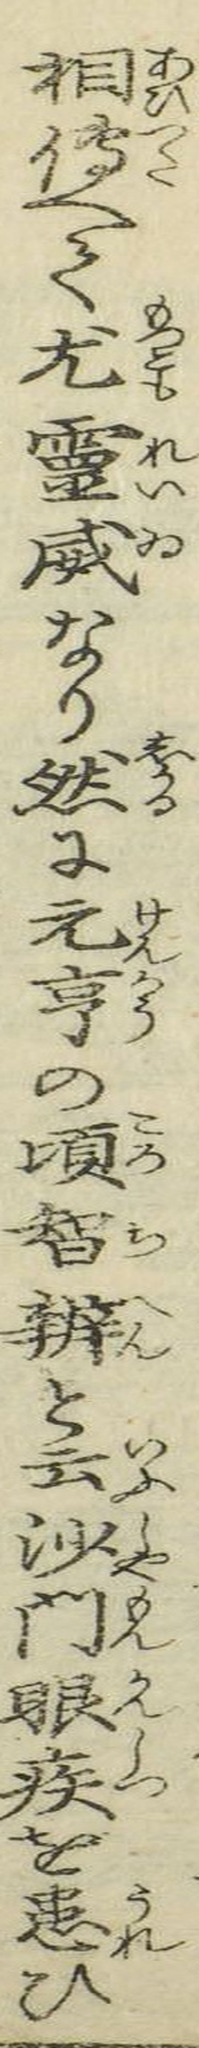相傳へて尤靈威なり然に元亨の頃智辨と云沙門眼疾を患ひ
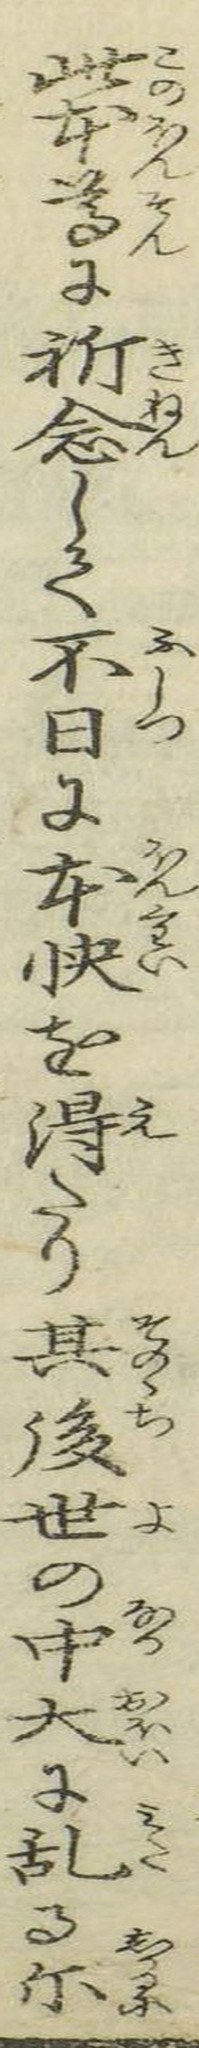此本尊に祈念して不日に本快を得たり其後世の中大に乱る尓
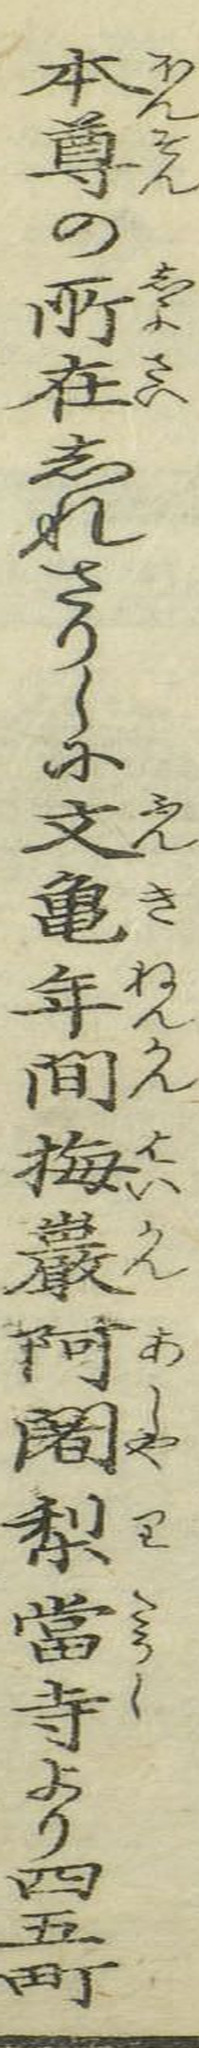本尊の所在しれさりしに文亀年間梅巖阿闍梨當寺より四五町

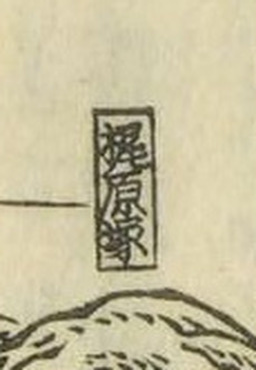梶原塚
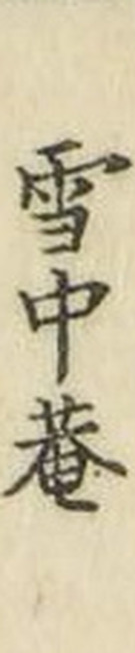雪中菴

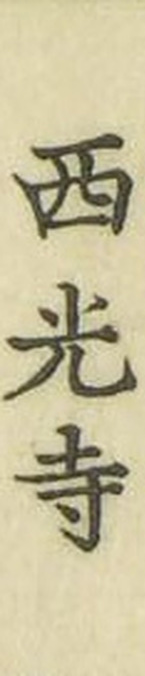西光寺

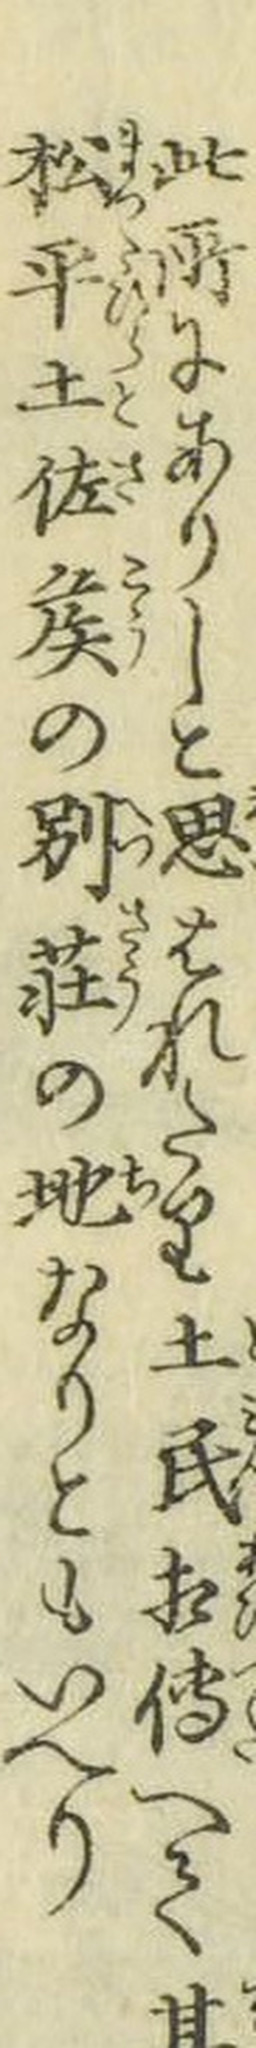松平土佐矦の別荘の地なりともいへり
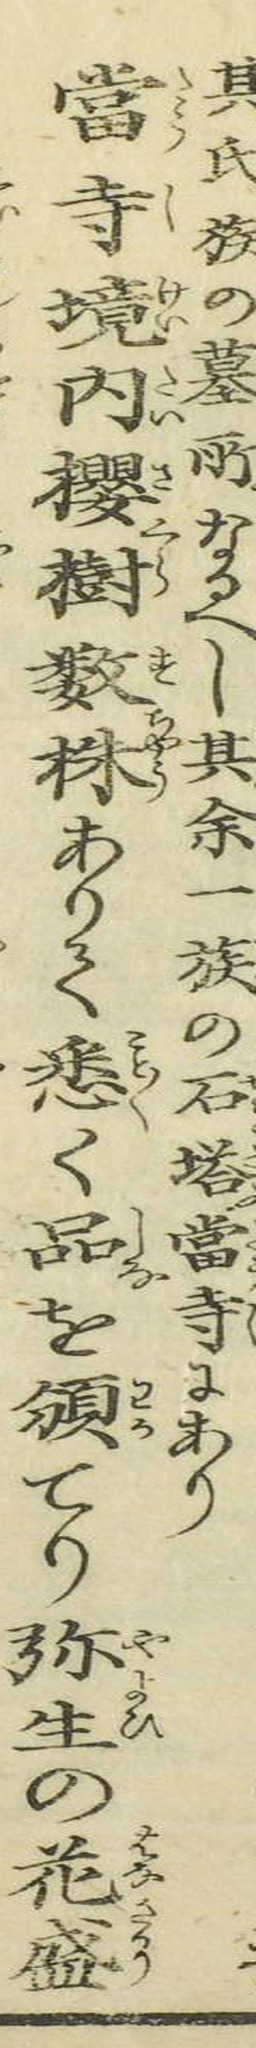當寺境内櫻樹数株ありて悉く品を頒てり弥生の花盛
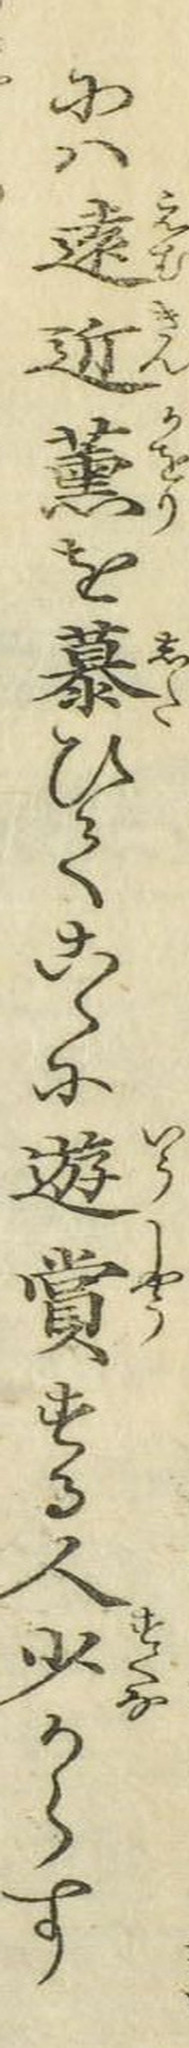には遠近薫を慕ひてこゝに遊賞する人少からす
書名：江戸名所図会 20巻 巻之4
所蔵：東京学芸大学教育コンテンツアーカイブ
